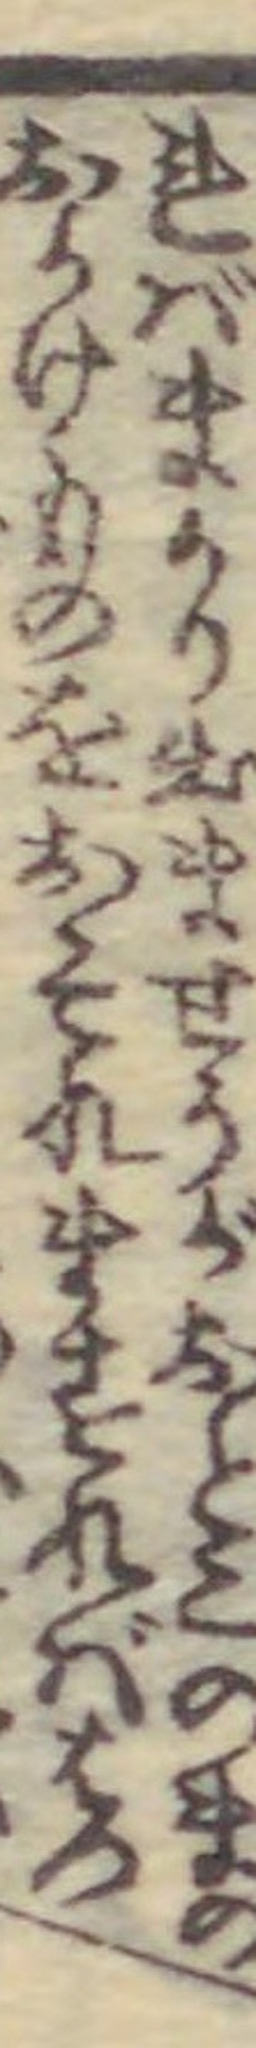おかけものをおそれますればはつ
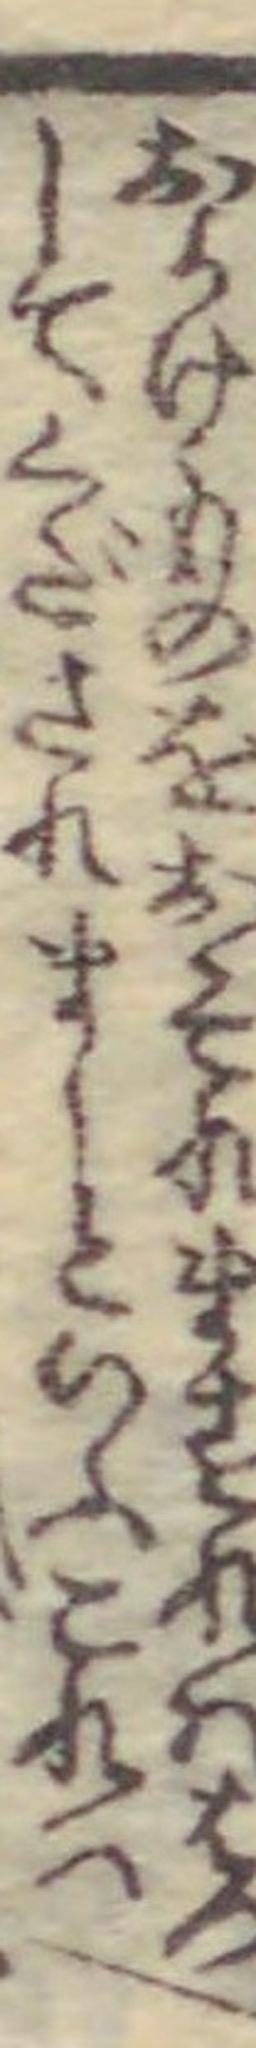してくだされましといふこれは
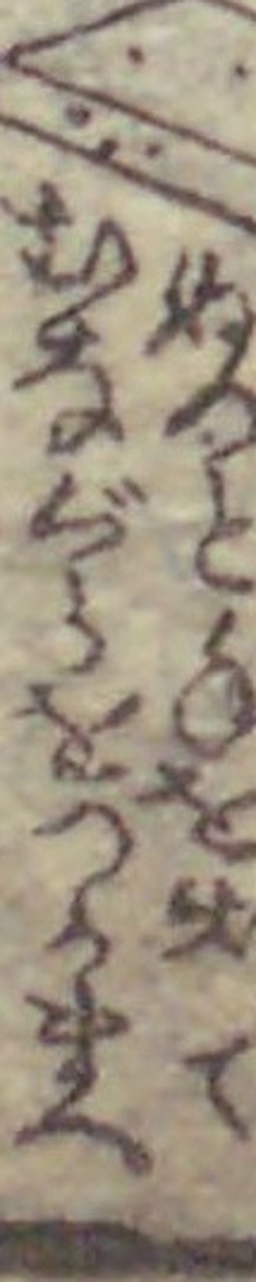むなぐらをつかまへ
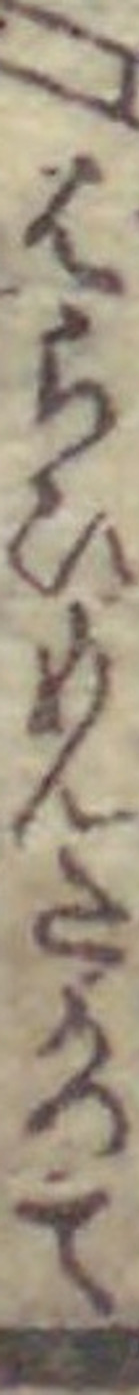はらひめんたかつて
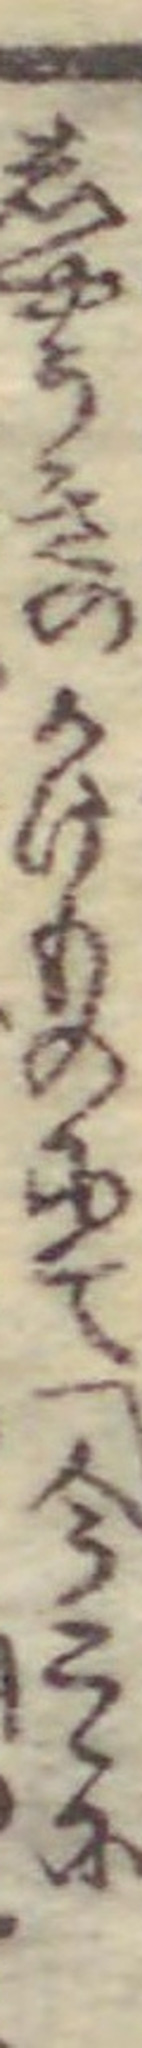しやうきのかけものにて〽今こゝに
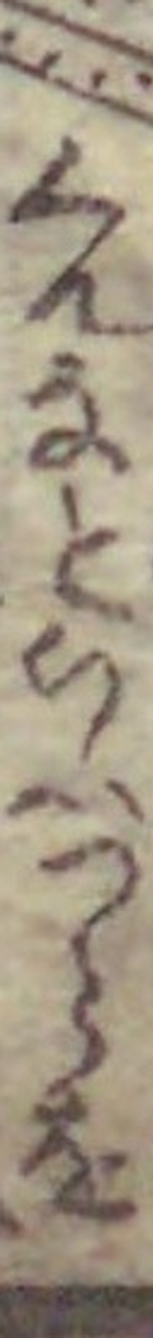くんなといゝつらを
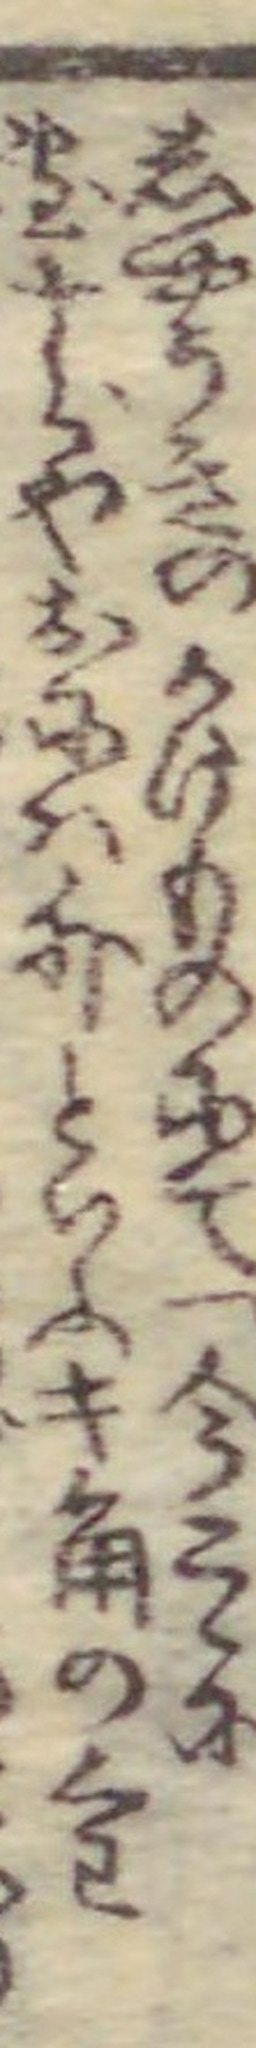團十郎やおには外といふキ角のくわ
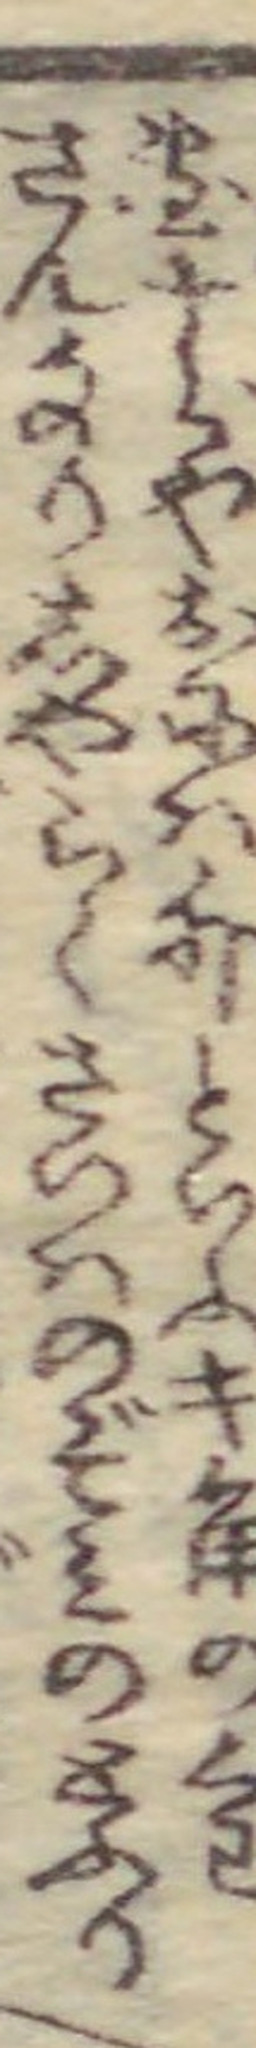さんなりしやらくさいはのぞみのとふり
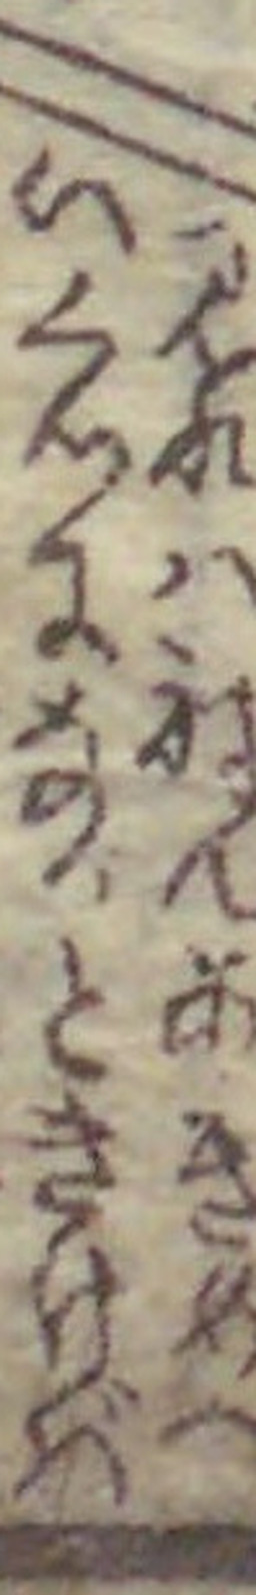いくつになるときけば
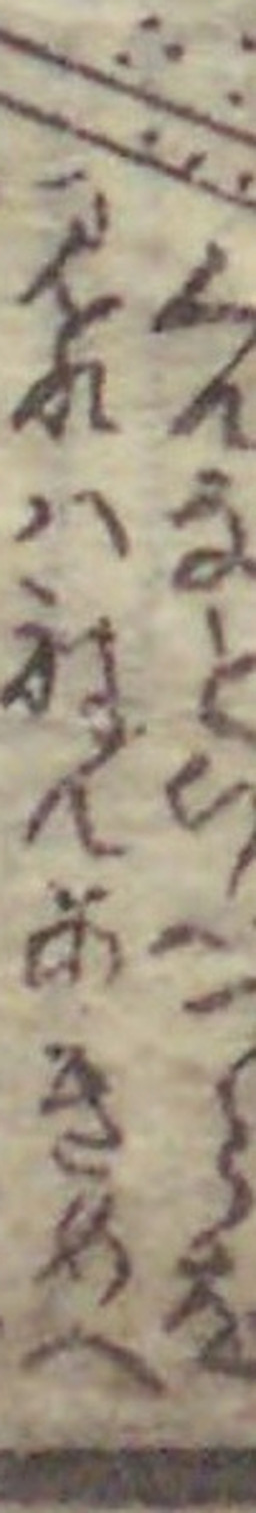見れはねんあきめへ
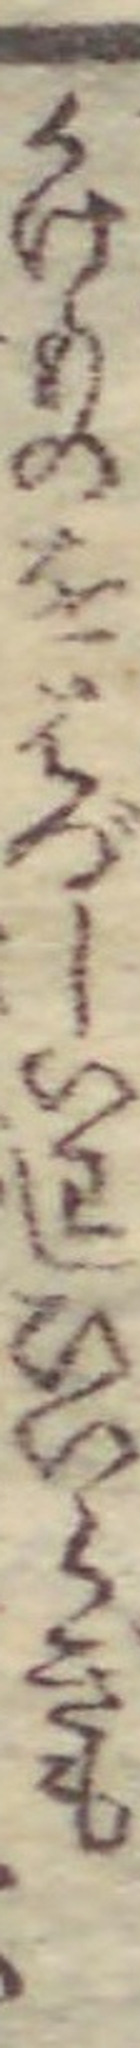かけものをはづしいわしひいらぎも
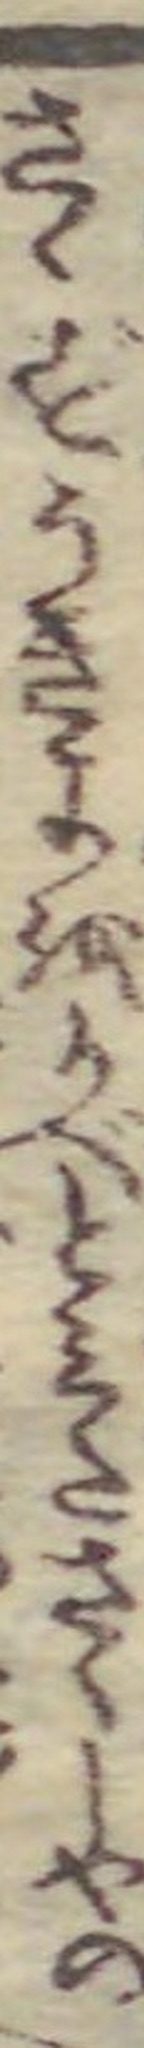さゝずうきよをかべとみたさくしやの
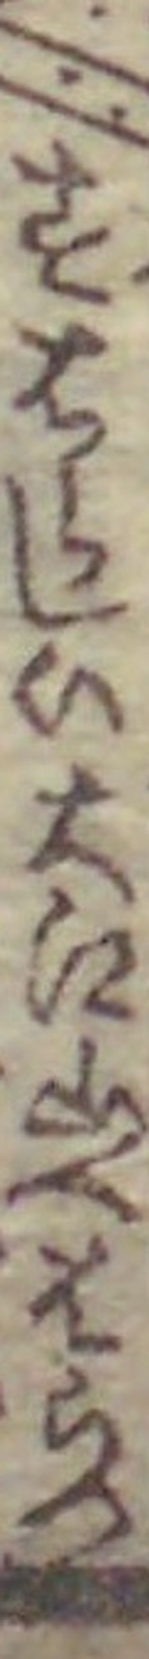すはらしい大江山へはらつ
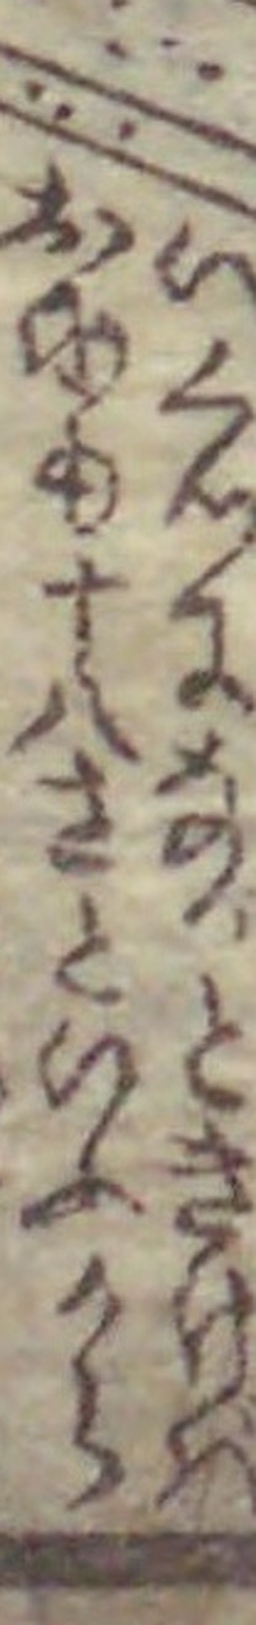おにも十八さといふから
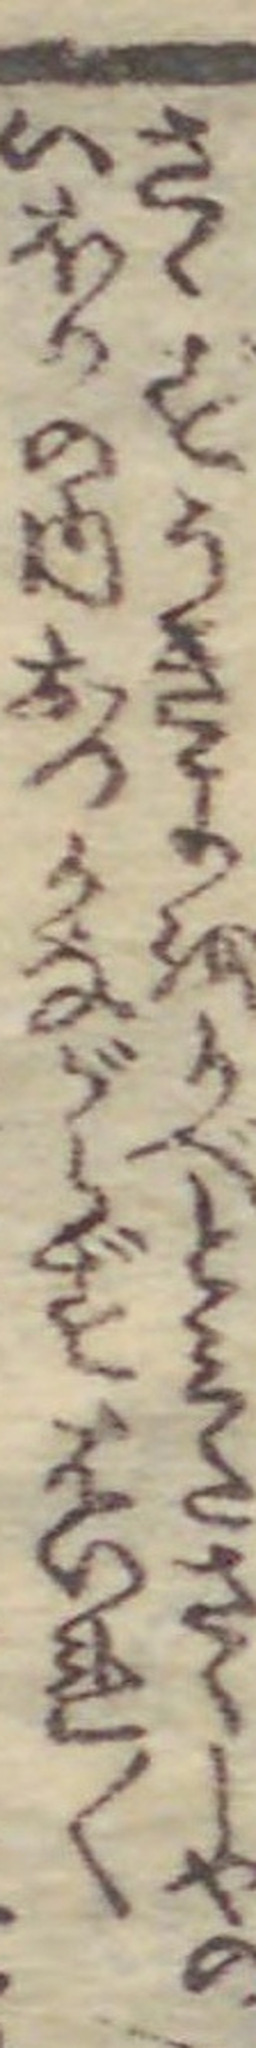いほりの内おつかながらずはいれ〳〵
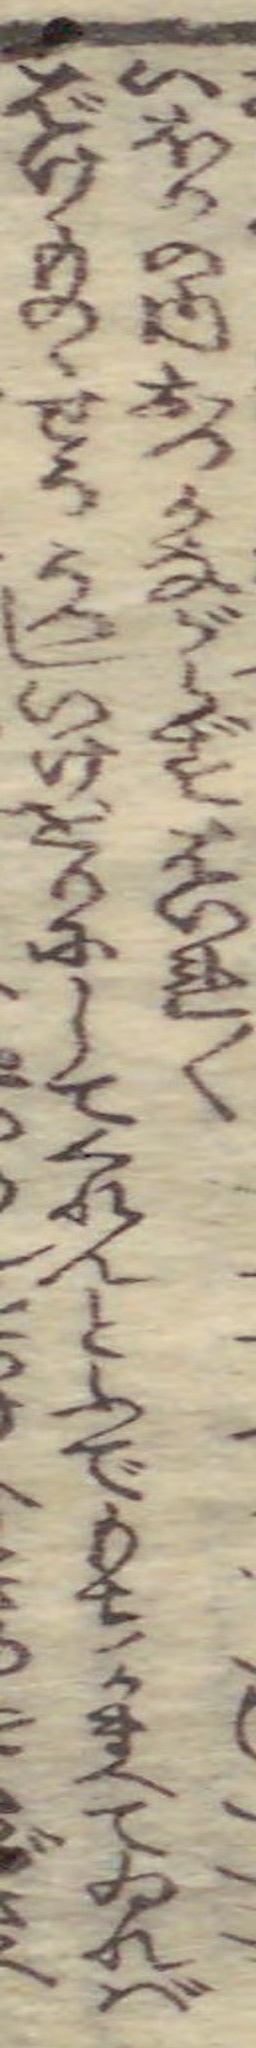ばけものゝせううつしいけをりにしてくれんとふでもちかまへてゐれば
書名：大時代唐土化物 3巻. 曽我太夫染
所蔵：国立国会図書館 National Diet Library, JAPAN
